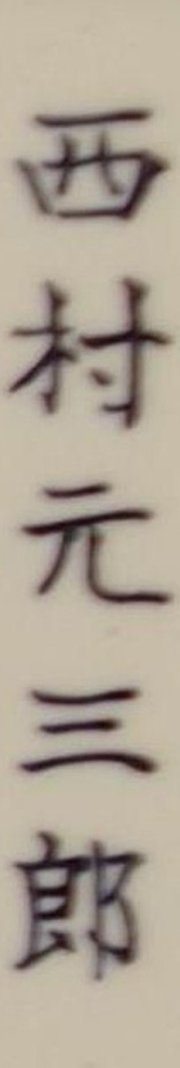西村元三郎
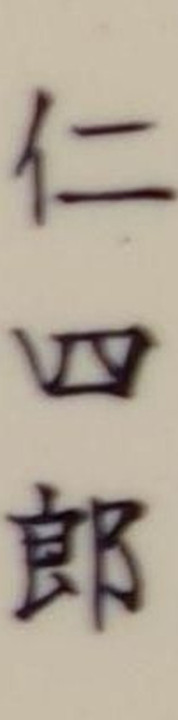仁四郎
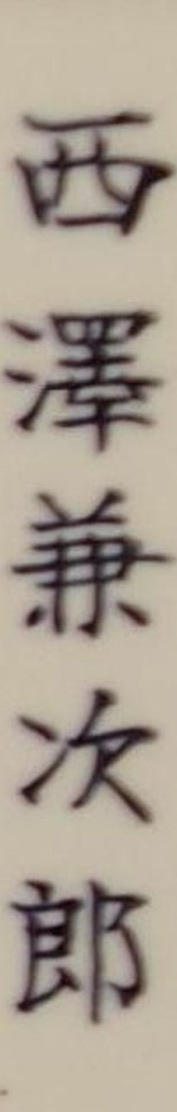西澤兼次郎
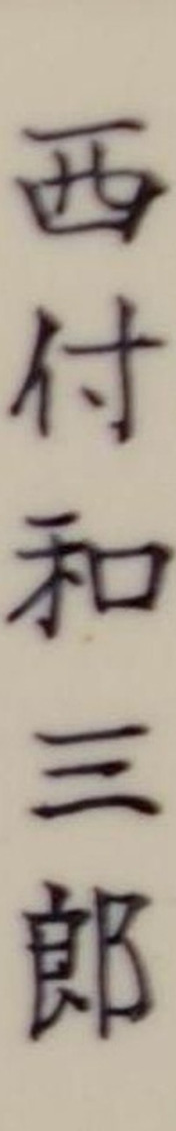西村元三郎
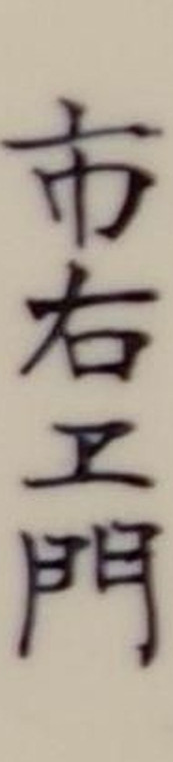市右ヱ門
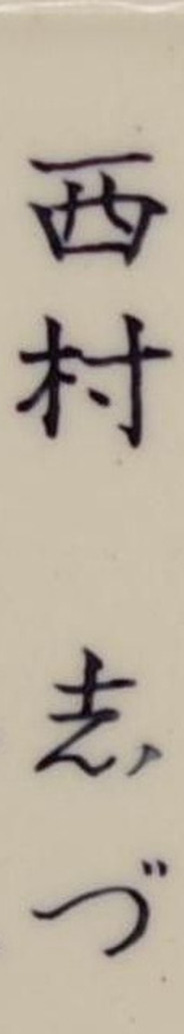西村しづ

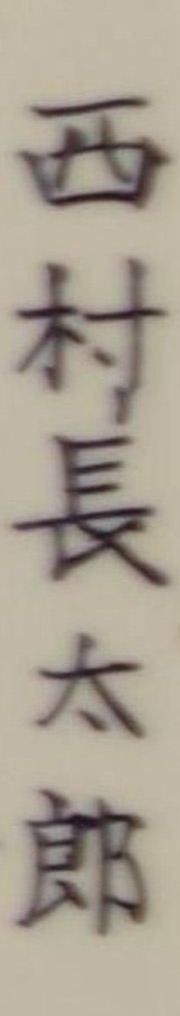西村長太郎
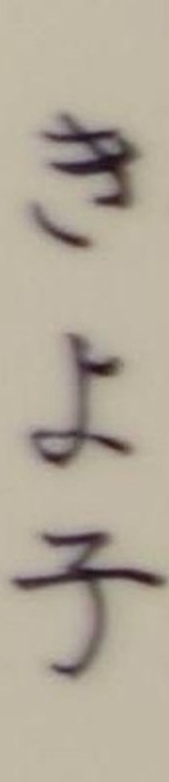きよ子
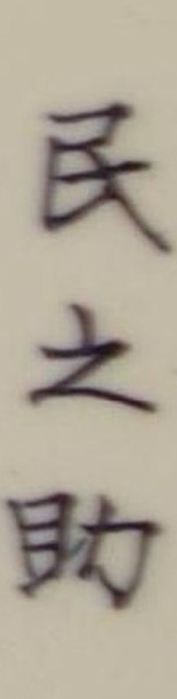民之助
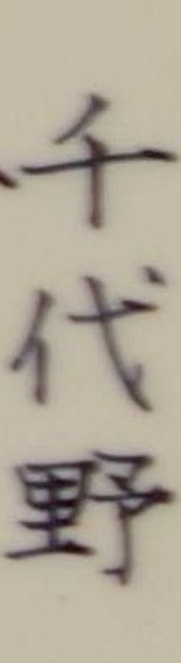千代野
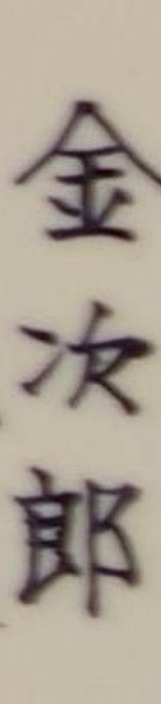金次郎
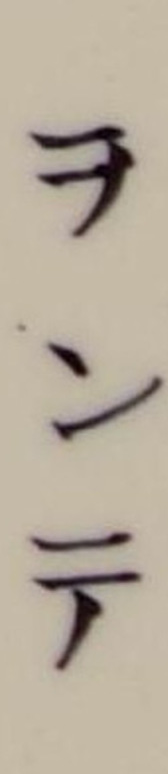ヲンテ
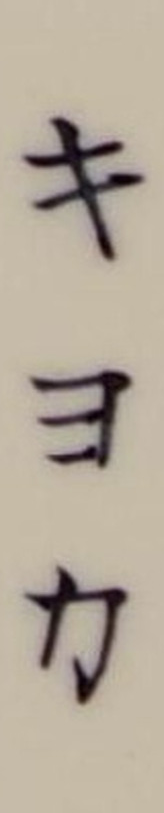キヨカ
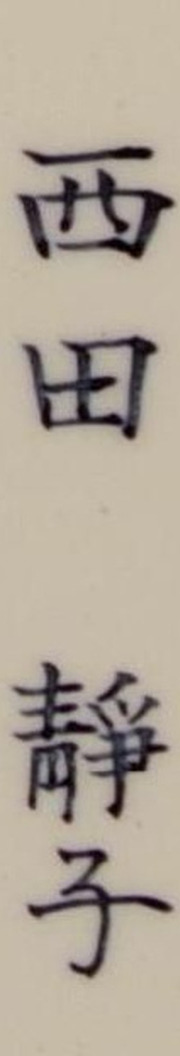西田静子
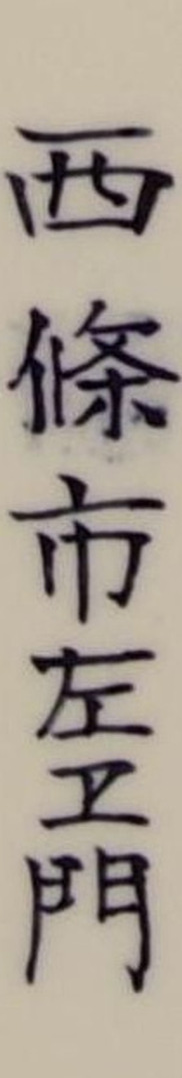西條市左ヱ門
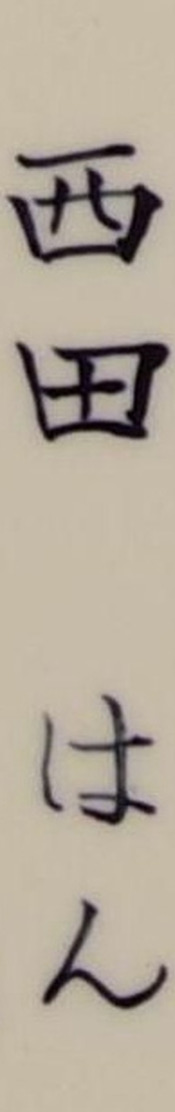西田はん
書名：M~S
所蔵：高野山金剛峯寺
